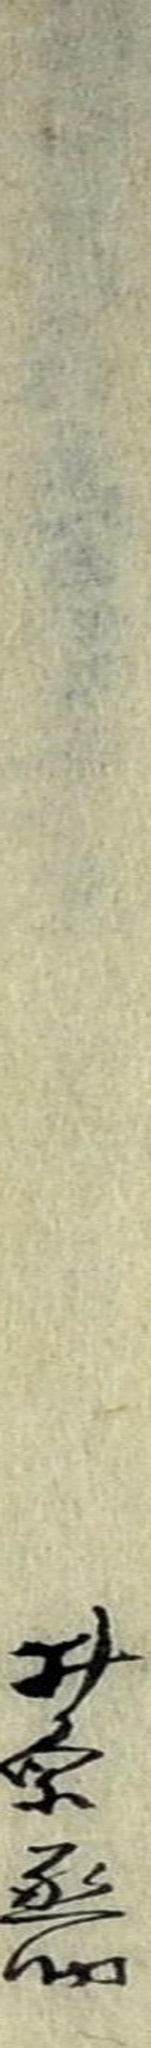井原丞助
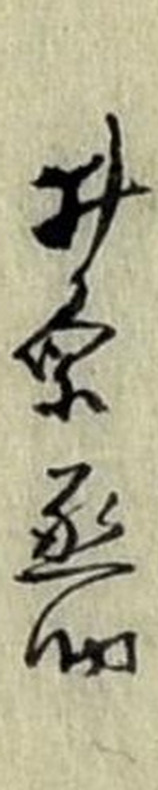井原丞助
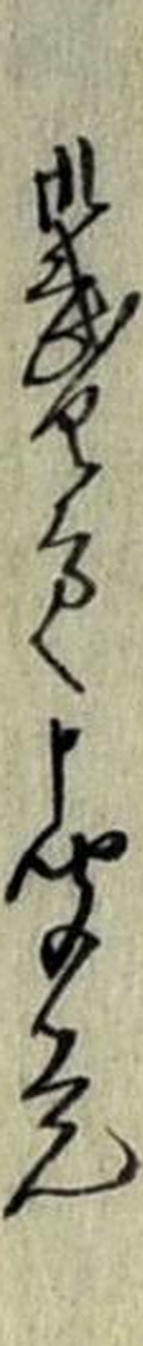御武具方へ申聞覚
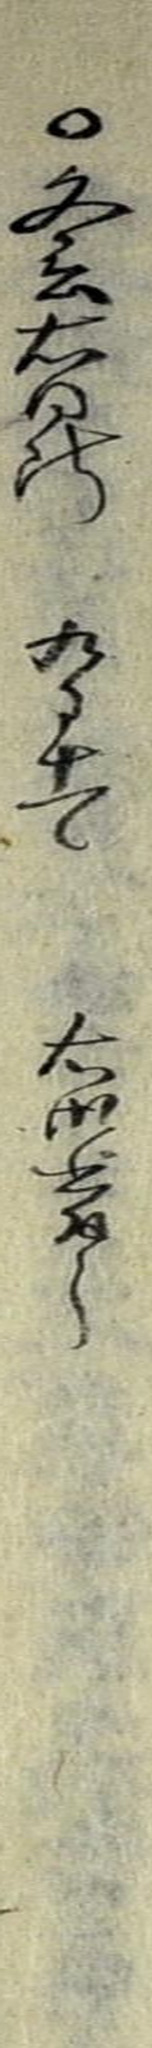〇文言右同断九月十一日右御書付之
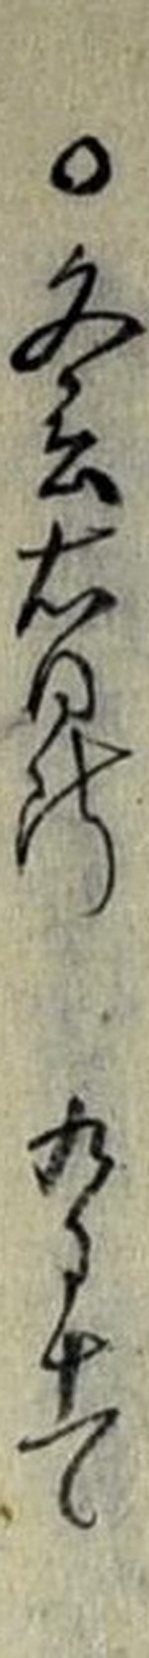〇文言右同断九月十一日
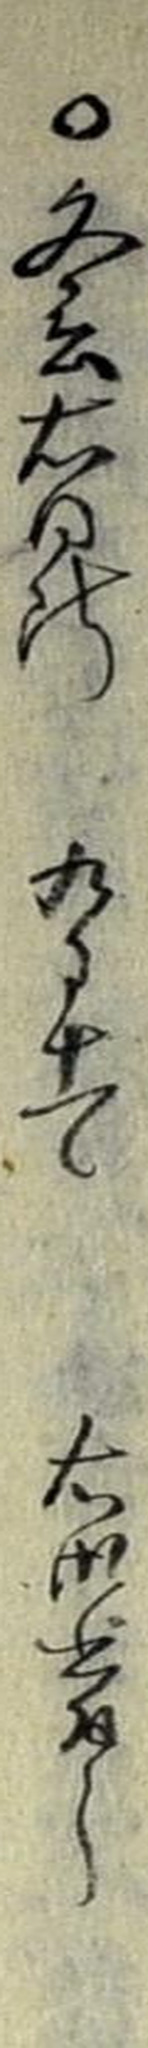〇文言右同断九月十一日右御書付之
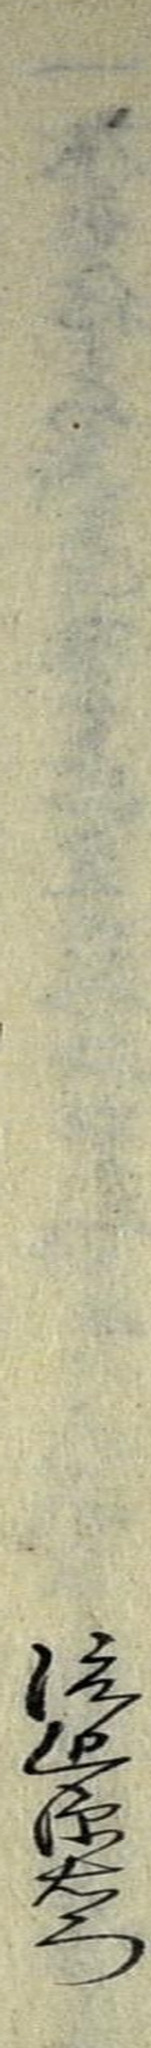渡辺源右衛門
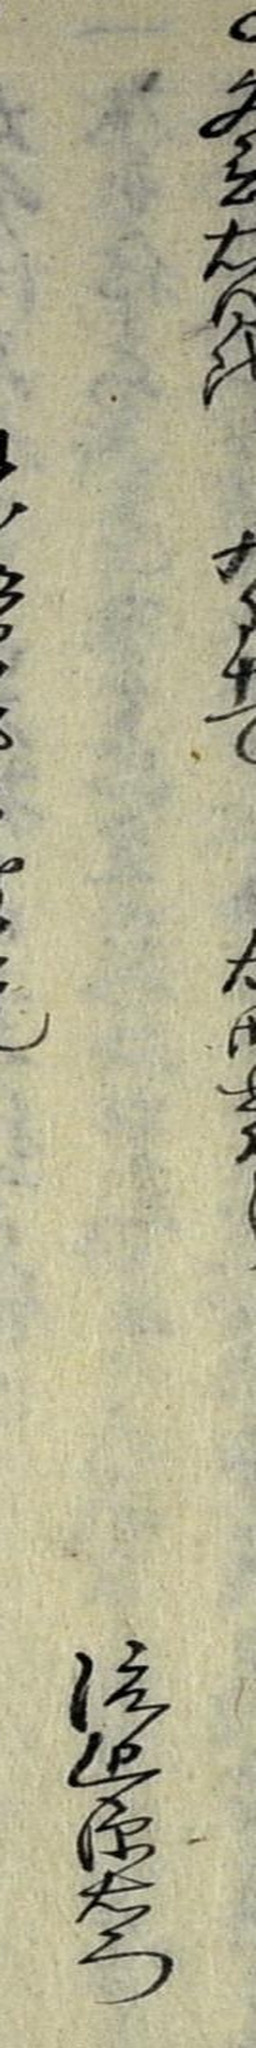渡辺源右衛門
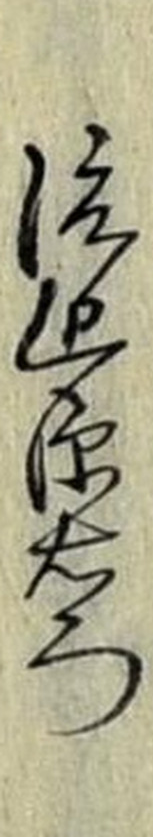渡辺源右衛門
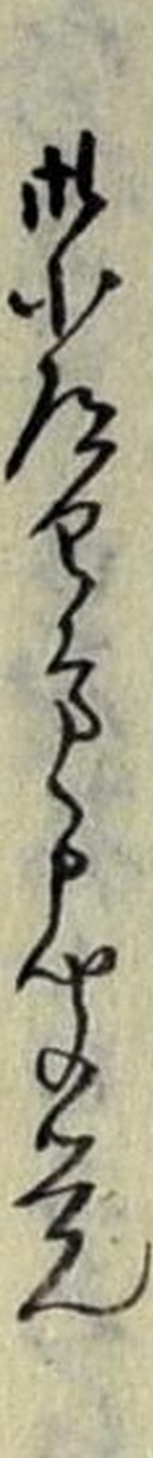御小道具方へ申聞覚
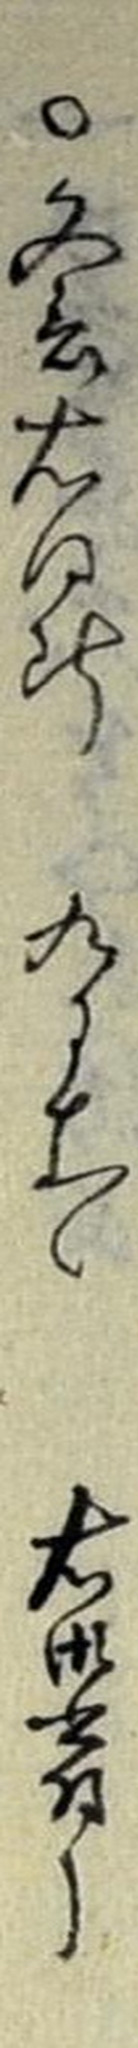〇文言右同断九月十一日右御書付之
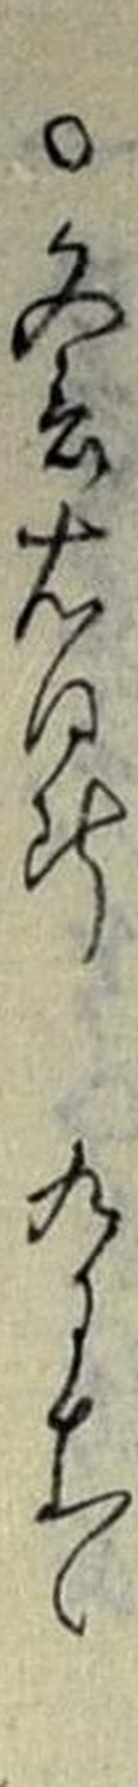〇文言右同断九月十一日
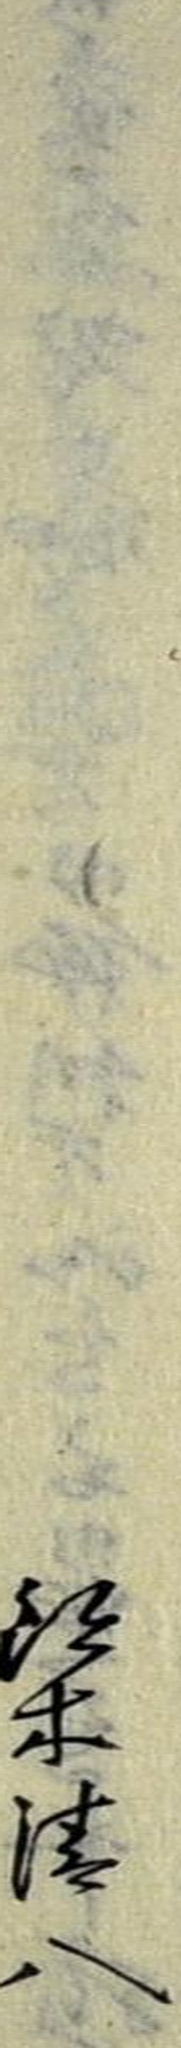鈴木清八
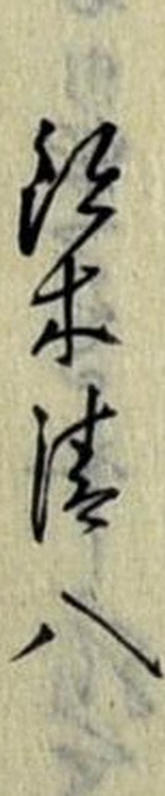鈴木清八
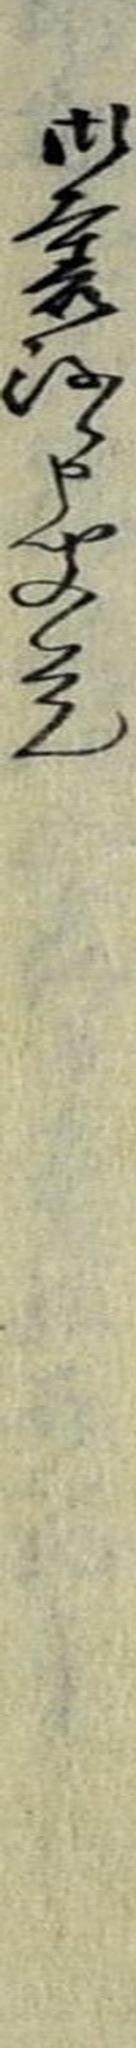御裏役へ申聞覚
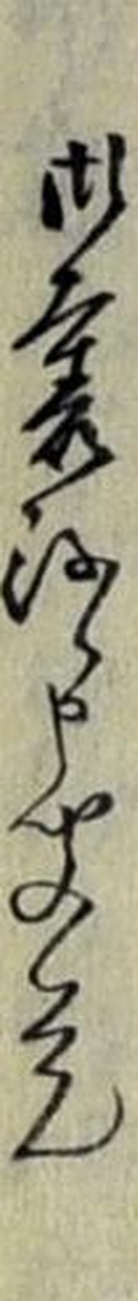御裏役へ申聞覚
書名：命令之部 一
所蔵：福井県文書館 Fukui Prefectural Archives
